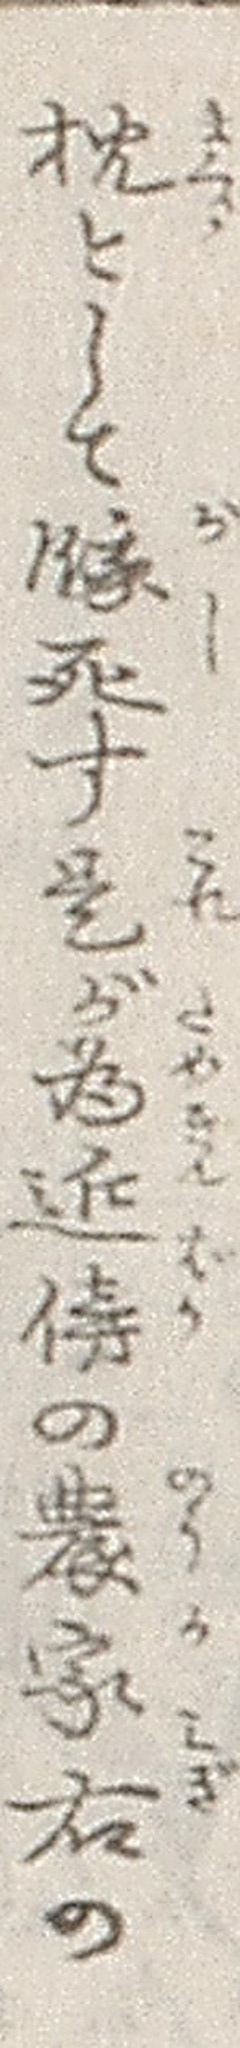枕として餓死す是が為近傍の農家右の
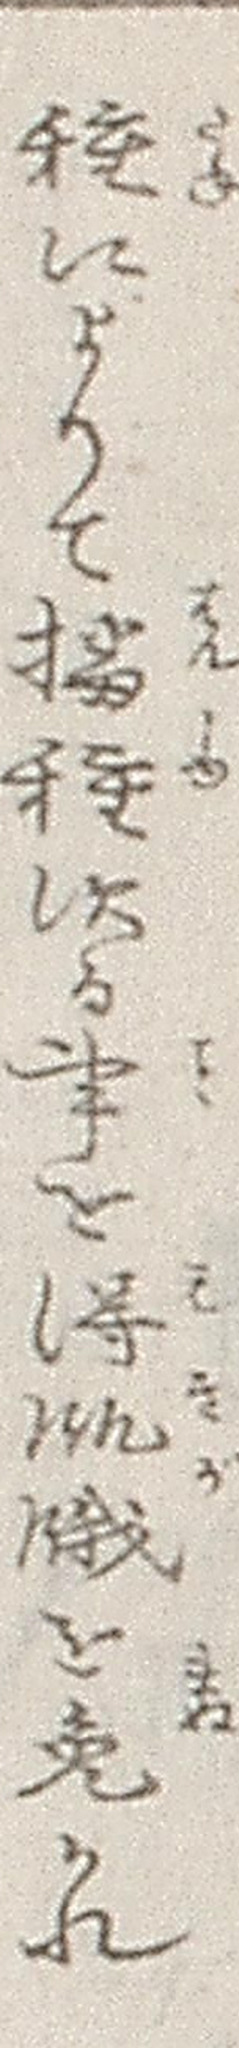種によりて播種する事を得飢餓を免かれ
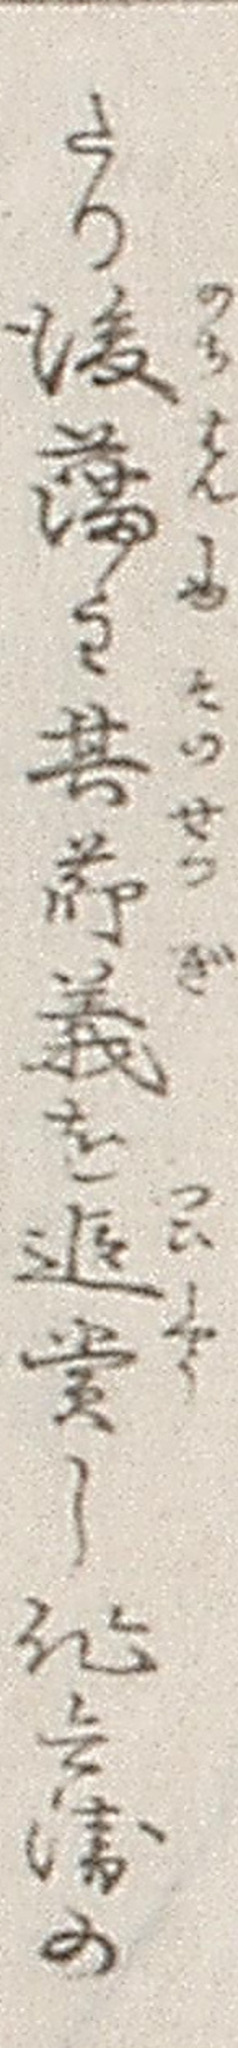たり後藩主其節義を追賞し作兵衛の
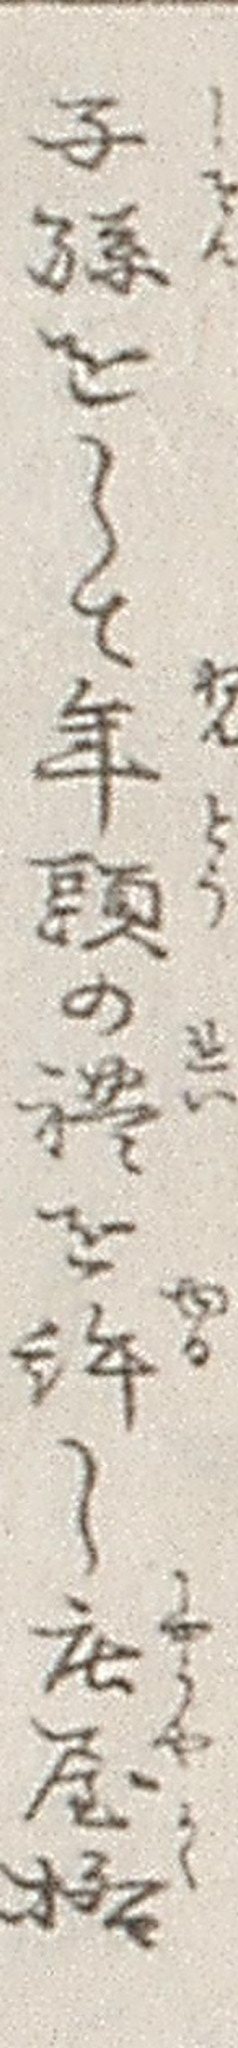子孫をして年頭の礼を許し庄屋格
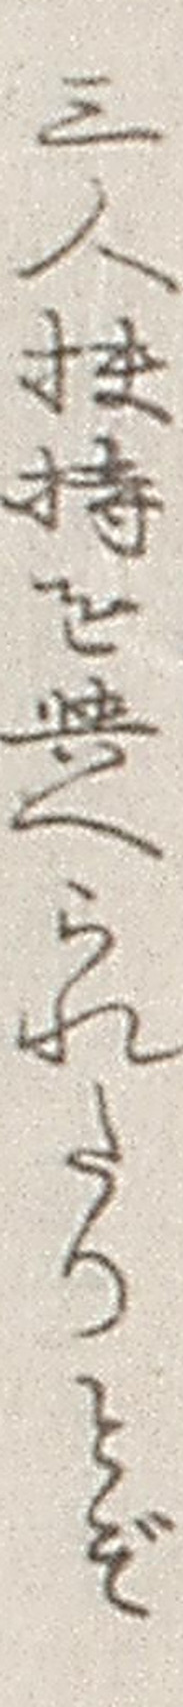三人扶持を與へられたりとぞ

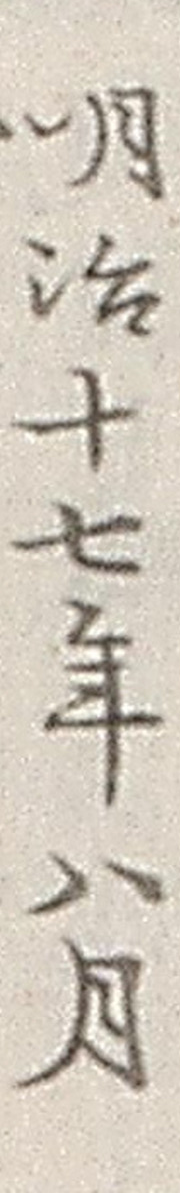明治十七年八月
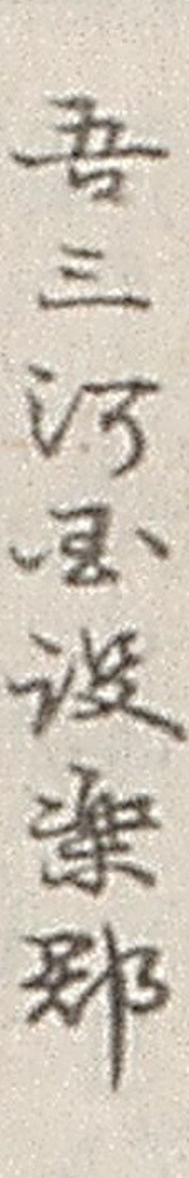吾三河国設楽郡
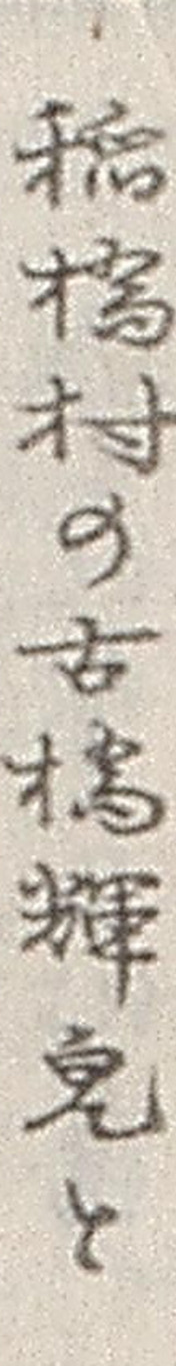稲橋村の古橋輝皃と
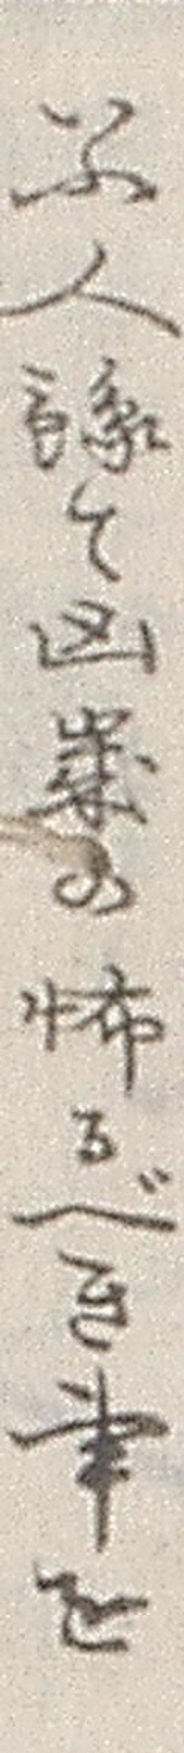いふ人豫て凶歳の怖るべき事を
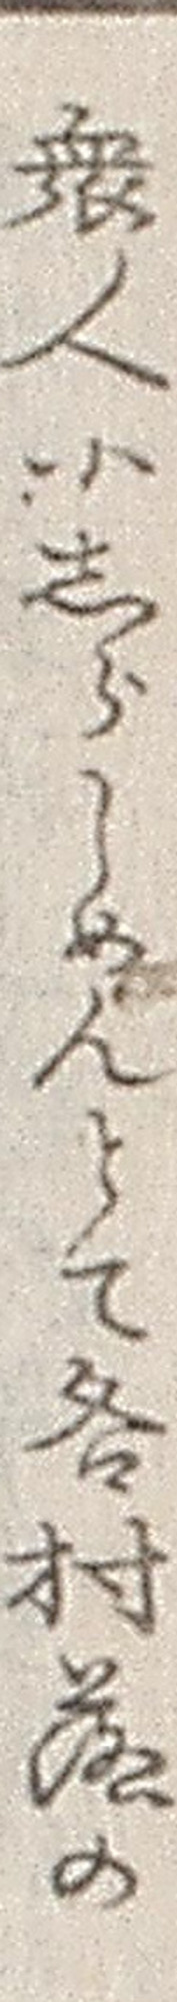衆人にしらしめんとて各村落の
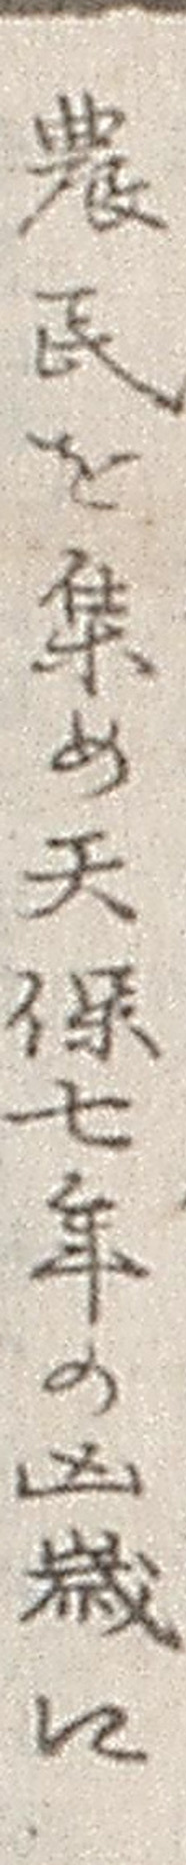農民を集め天保七年の凶歳に
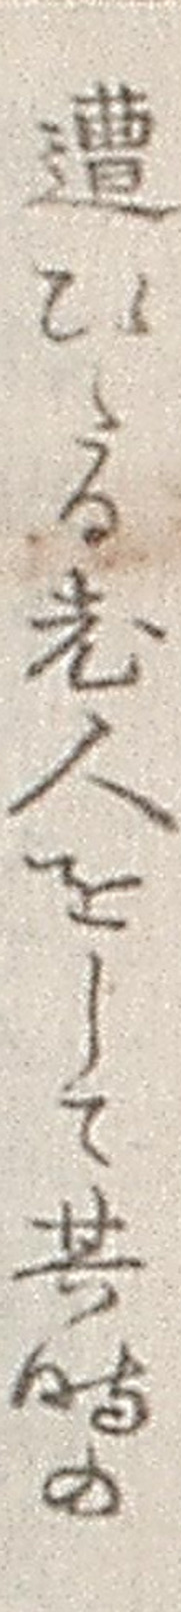遭ひたる老人をして其時の
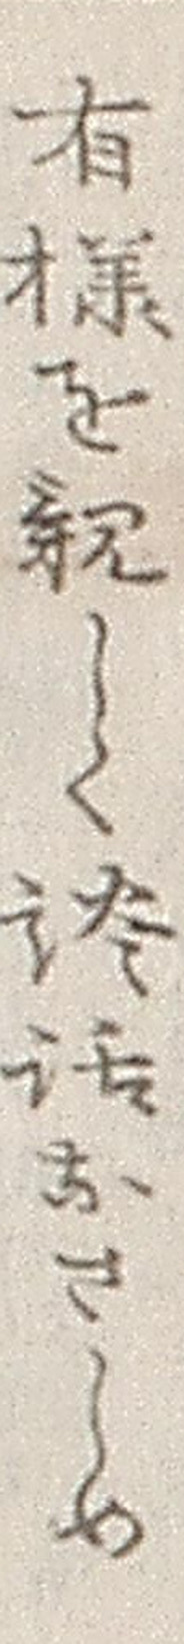有様を親しく談話なさしめ
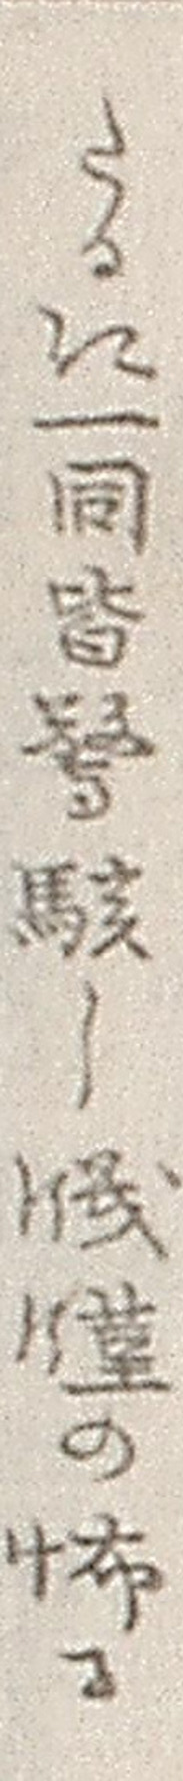たるに一同皆驚駭し饑饉の怖る
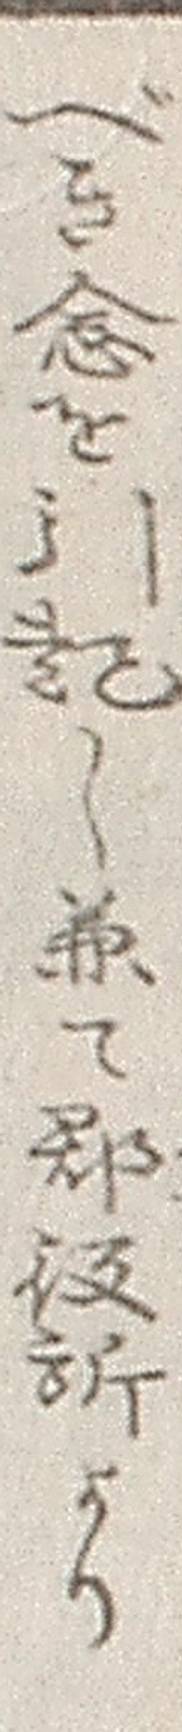べき念を引起し兼て郡役所より
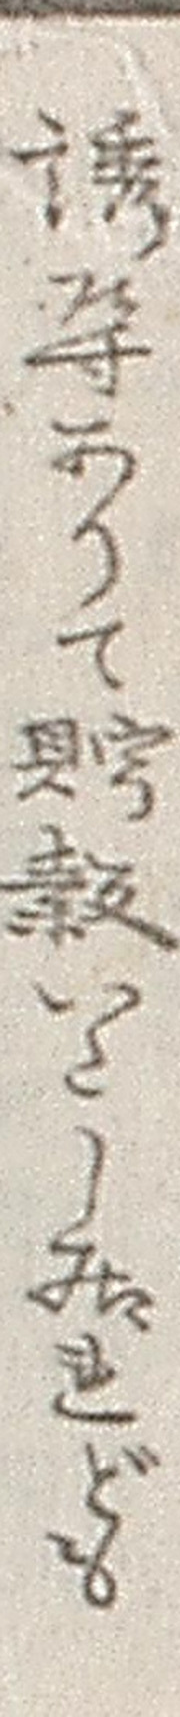誘導ありて貯穀いたし居れども
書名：凶荒図録　完
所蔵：東京大学地震研究所図書室 Earthquake Research Institute Library, The University of Tokyo, JAPAN
